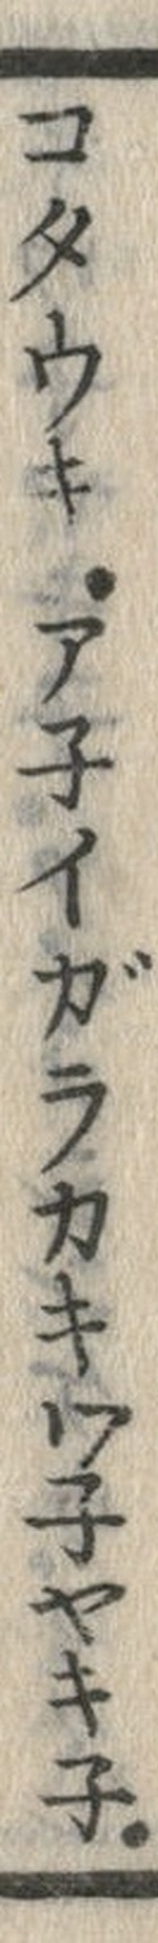コタウキ。アネイガラカキワネヤキネ。
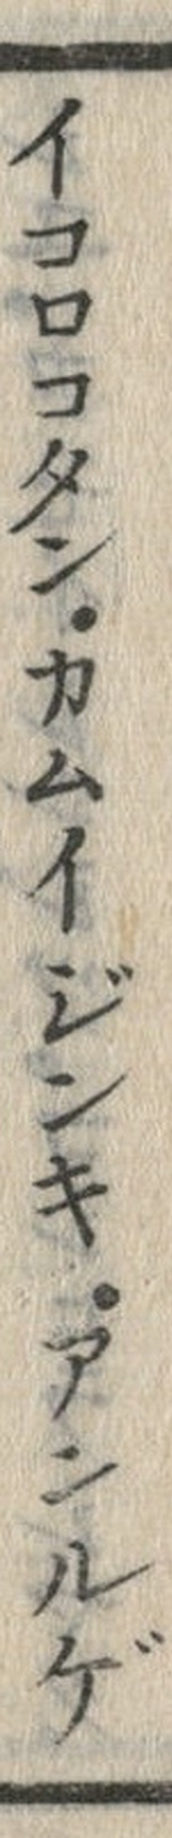イコロコタン。カムイジンキ。アンルゲ
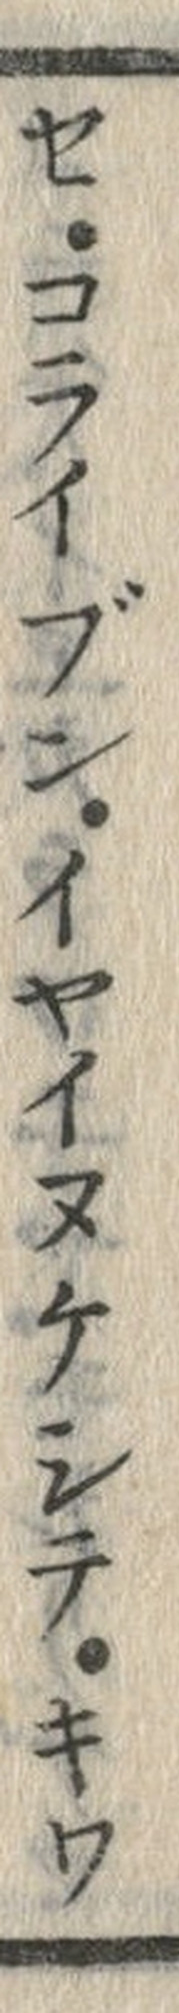セ。コライブン。イヤイヌケシテ。キワ
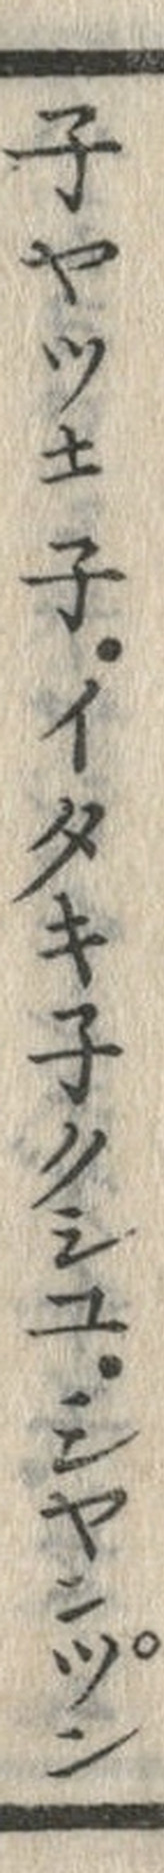ネヤツキネ。イタキネクシユ。シヤンツ゚ン
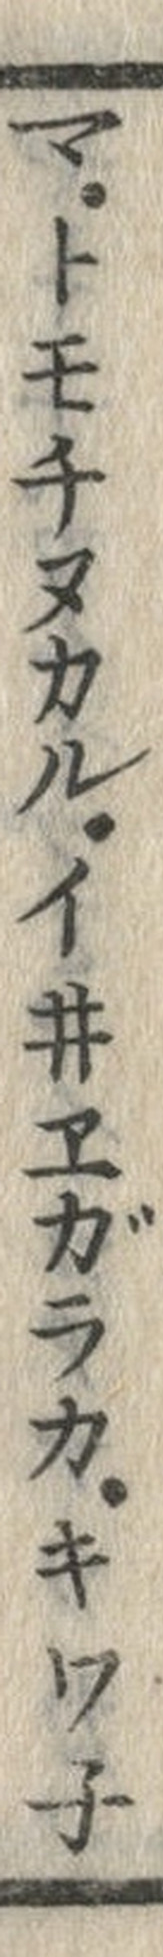マ。トモチヌカル。イヰヱガラカ。キワネ

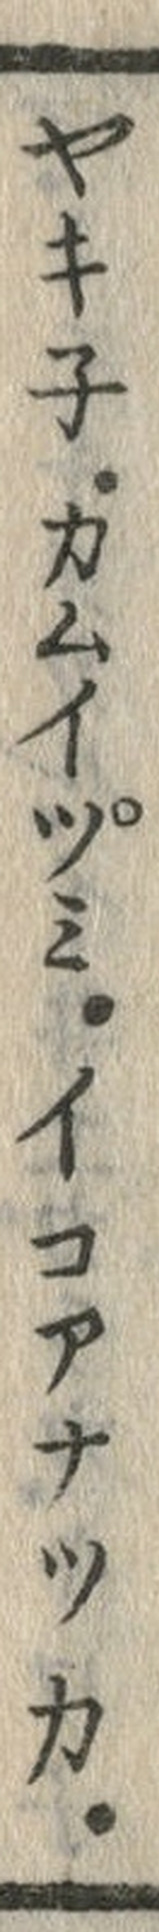ヤキネ。カムイツ゚ミ。イコアナツカ。
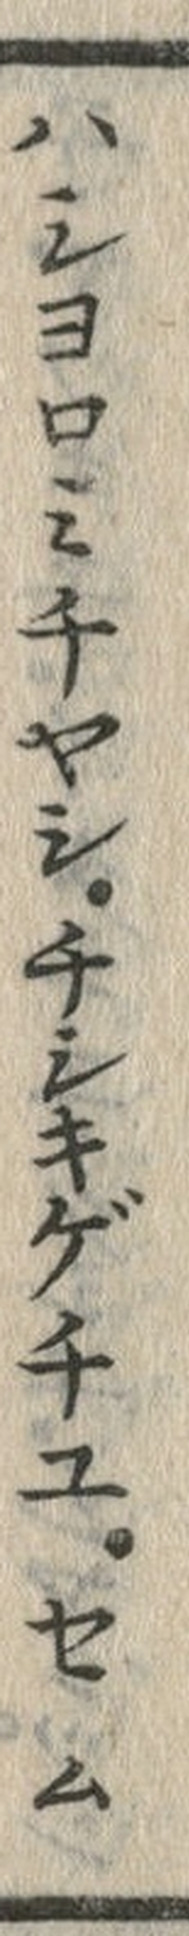ハシヨロミチヤシ。チシキゲチユ。セム
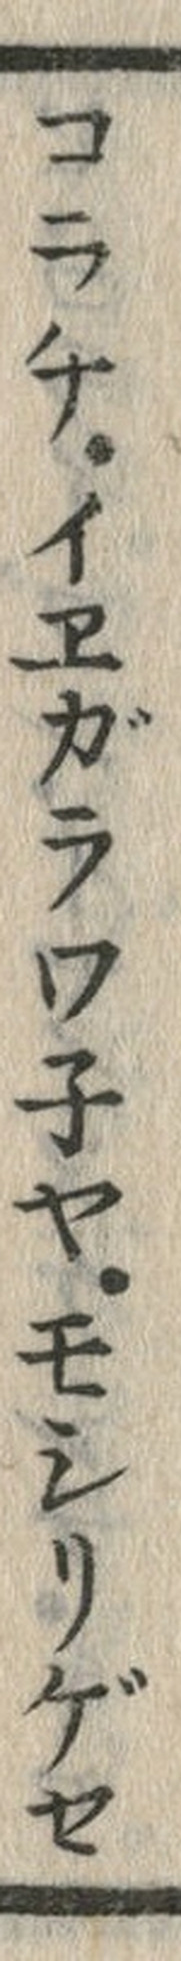コラチ。イヱガラワネヤ。モシリゲセ
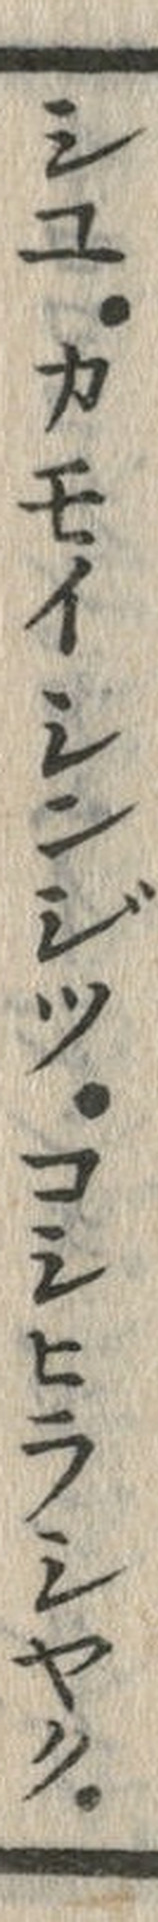シユ。カモイシンジツ。コシヒラシヤク。
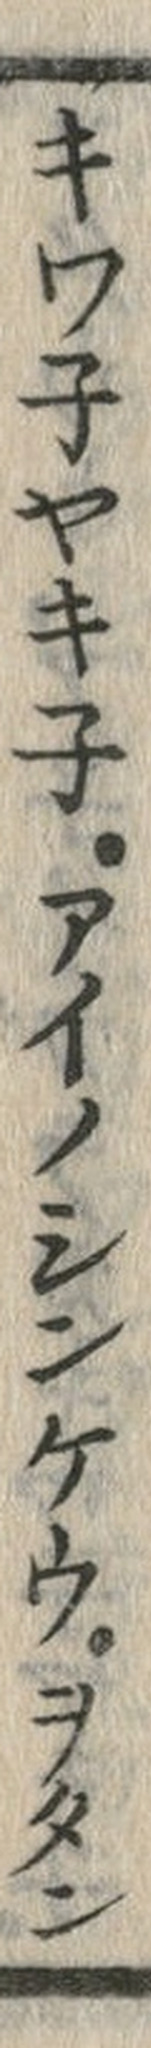キワネヤキネ。アイノシンケウ。ヲタン
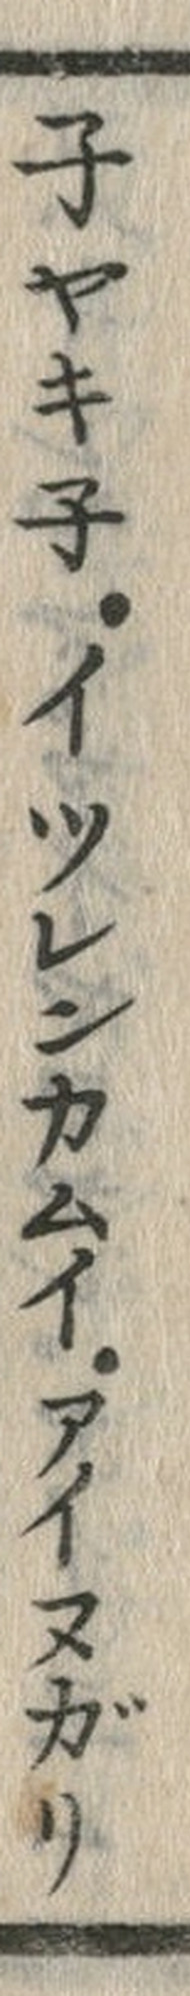ネヤキネ。イツレンカムイ。アイヌガリ
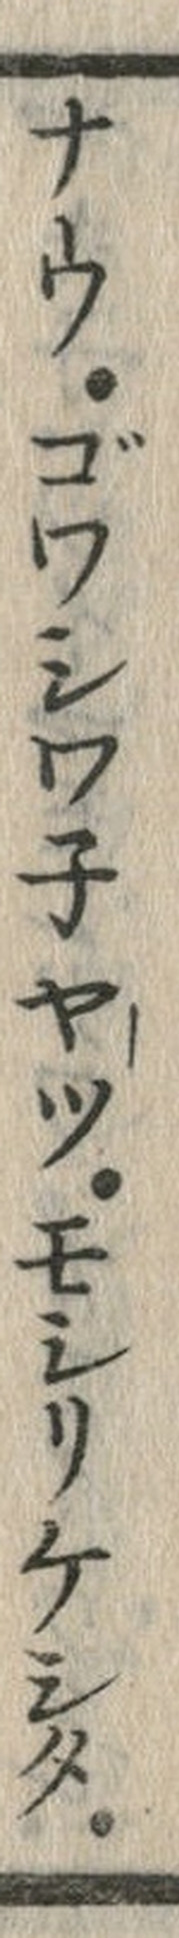ナウ。ゴワシワネヤツ。モシリケシタ。
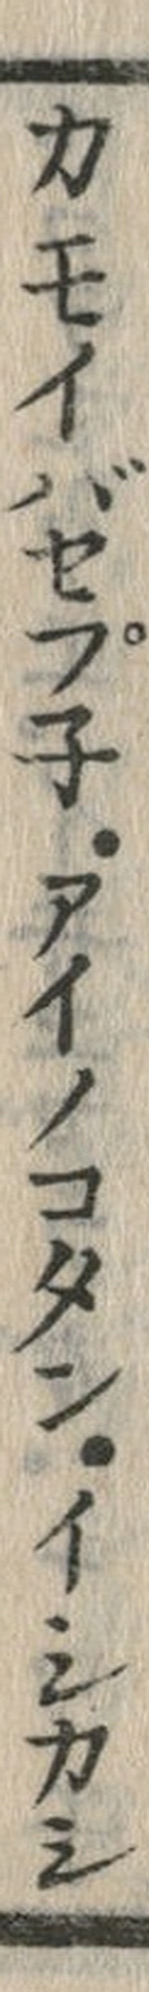カモイバセプネ。アイノコタン。イシカシ

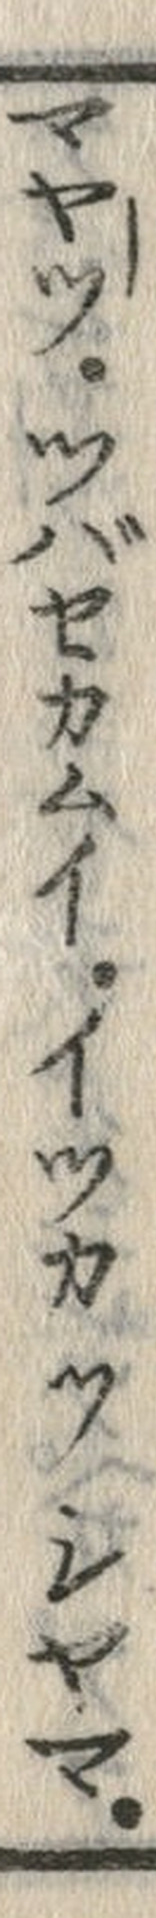マヤツ。ツバセカムイ。イツカツシヤマ。
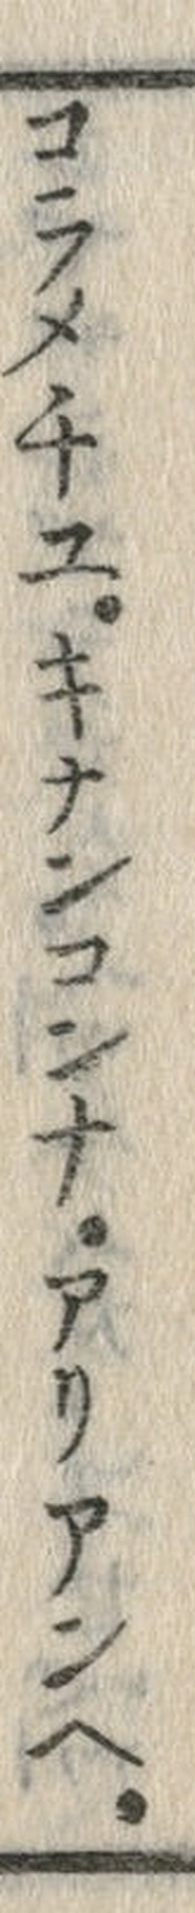コラメチユ。キナンコンナ。アリアンヘ。
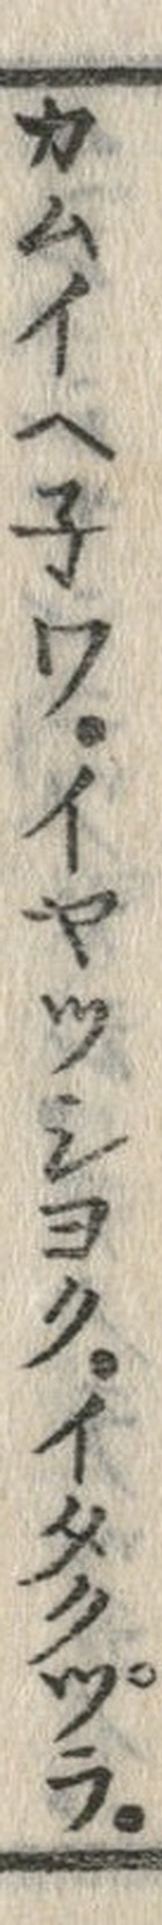カムイヘネワ。イヤツシヨク。イタクツ゚ラ。
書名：蝦夷方言藻汐草　坤巻
